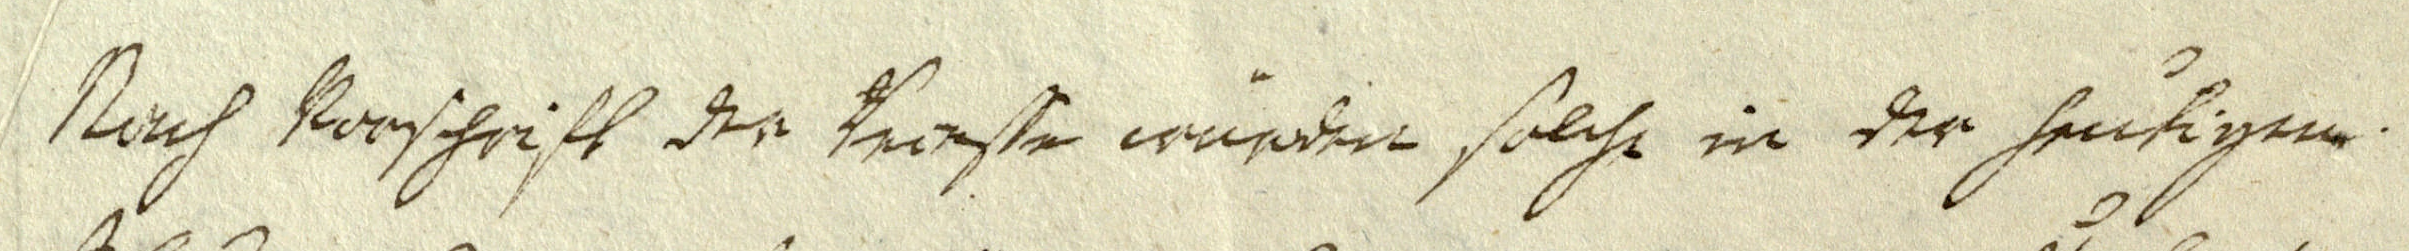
Nach Vorschrift der Recesse würden solche in der heutigen
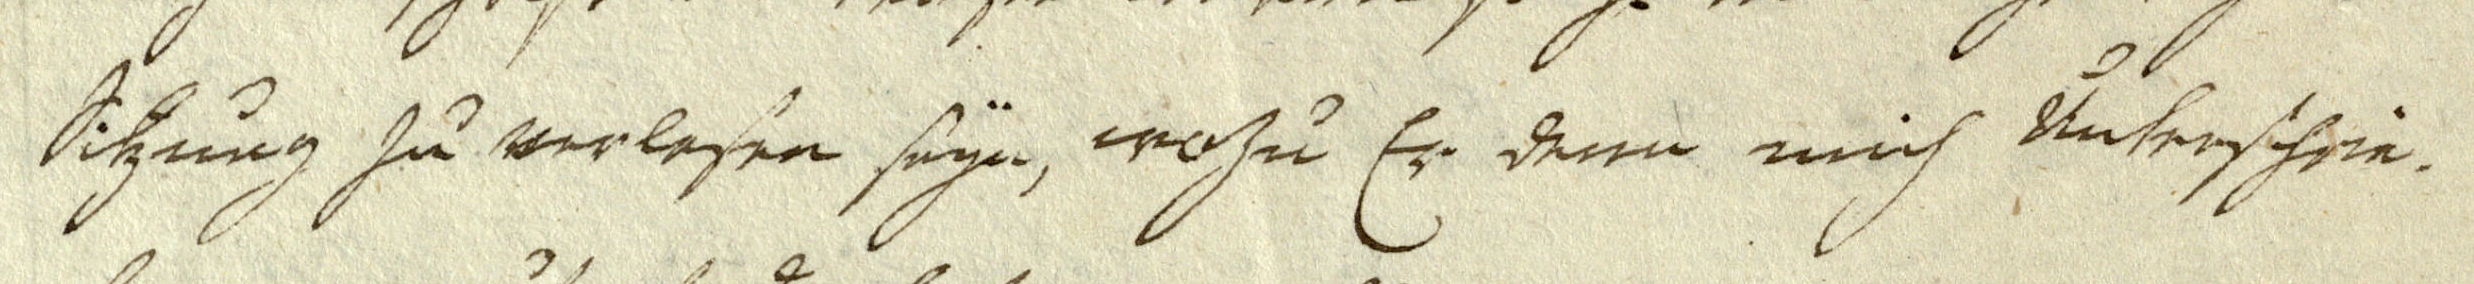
Sitzung zu verlesen seÿn, wozu Er denn mich Unterschrie¬
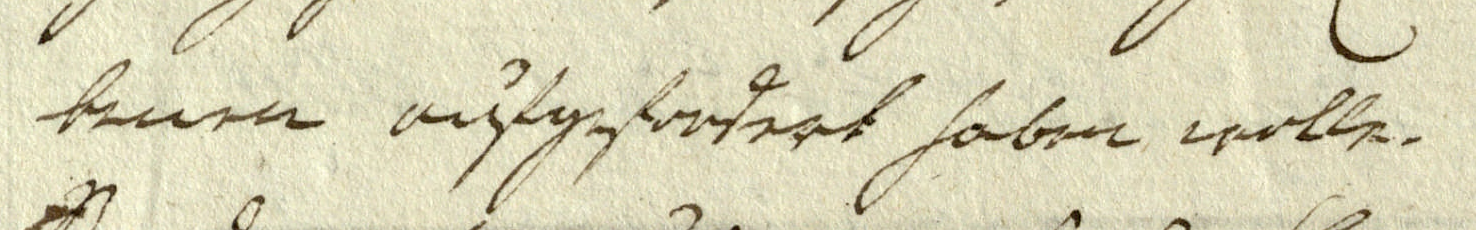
benen aufgefordert haben wolle.
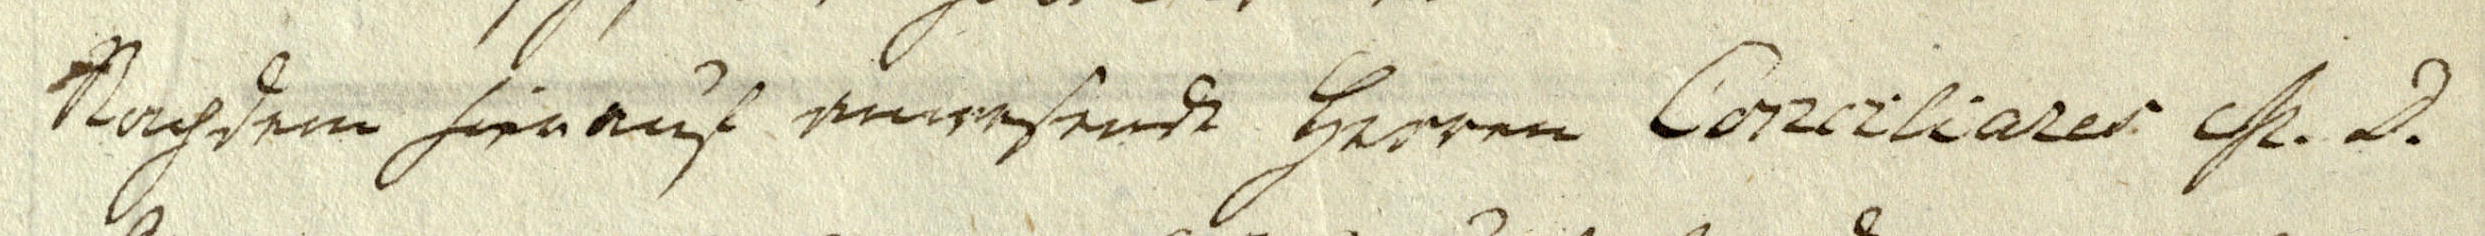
Nachdem hierauf anwesende Herren Conciliares M. D.
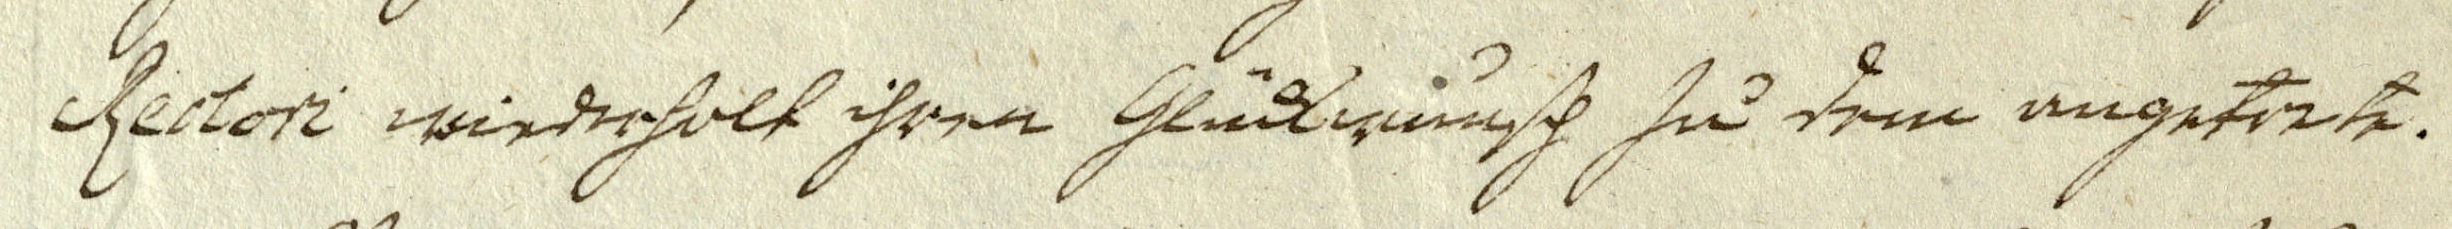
Rector wiederholt ihren Glückwunsch zu dem angetrete¬
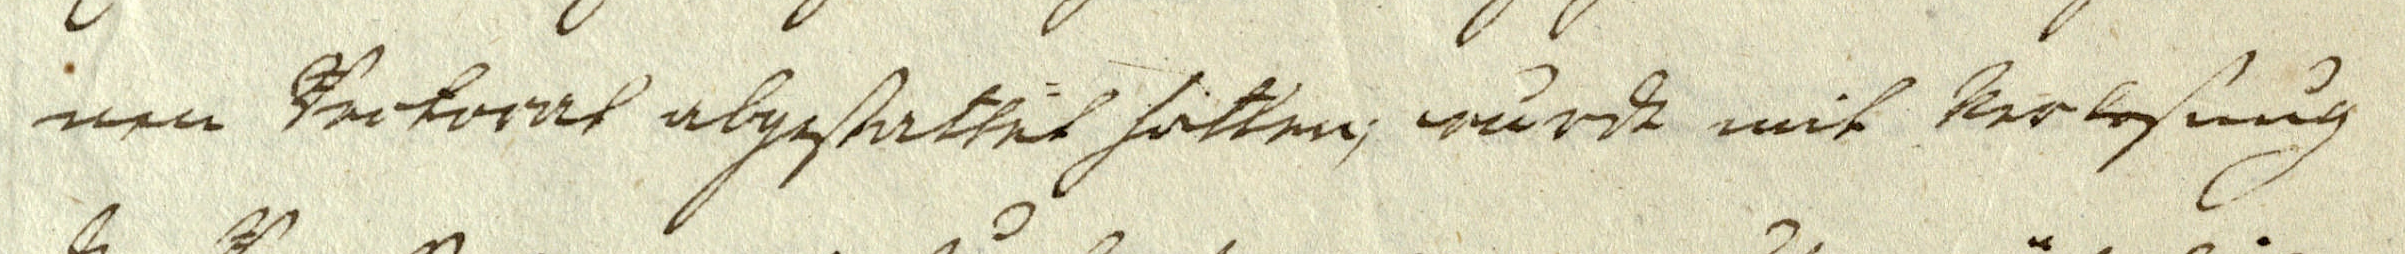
nen Rectorat abgestattet hatten, wurde mit Verlesung
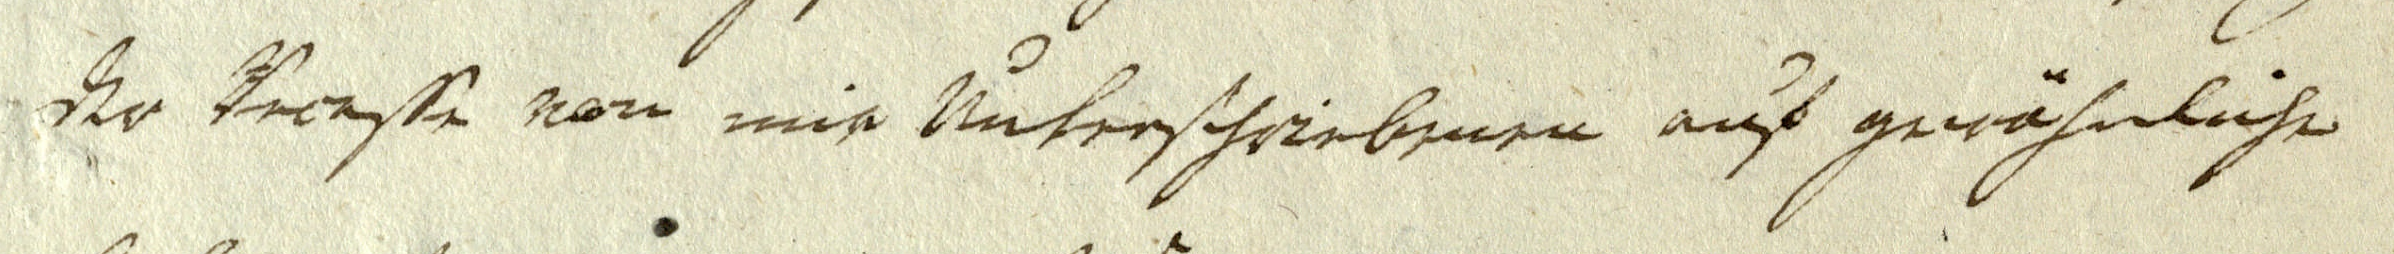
der Recesse von mir Unterschriebenen auf gewöhnliche
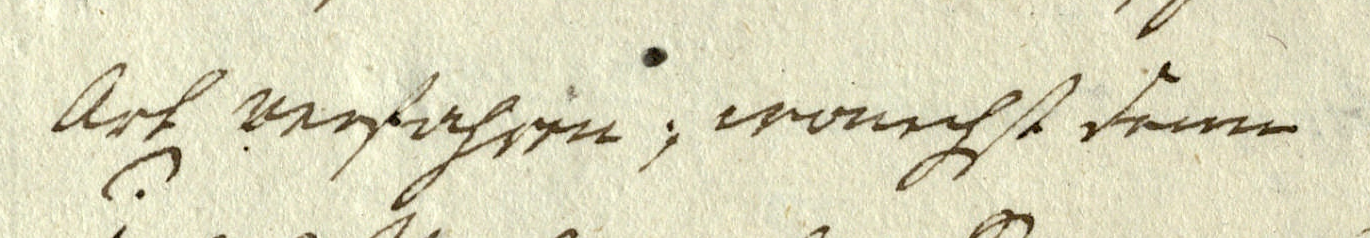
Art verfahren; wonechst denn
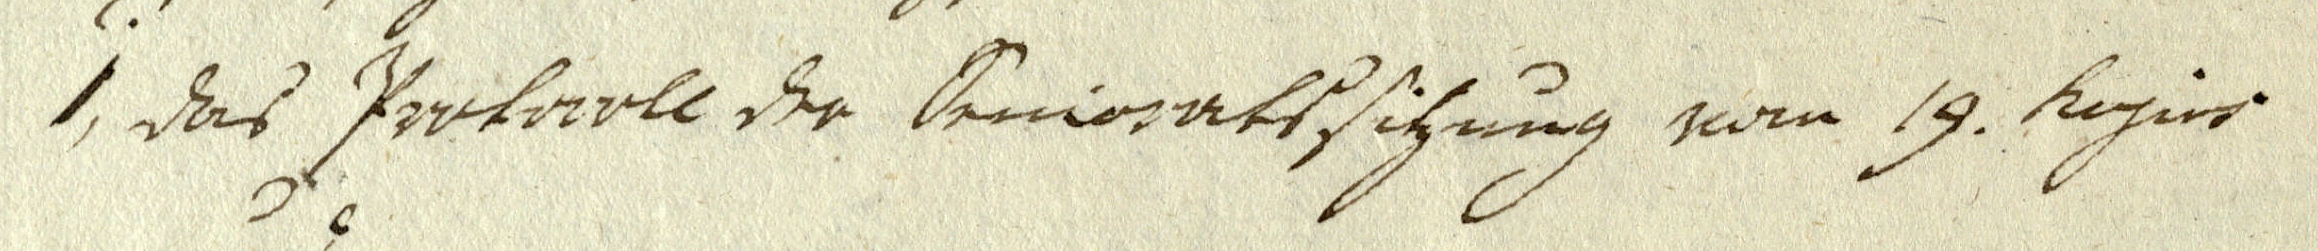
1, das Protocoll der Senioratssitzung vom 19. hujus
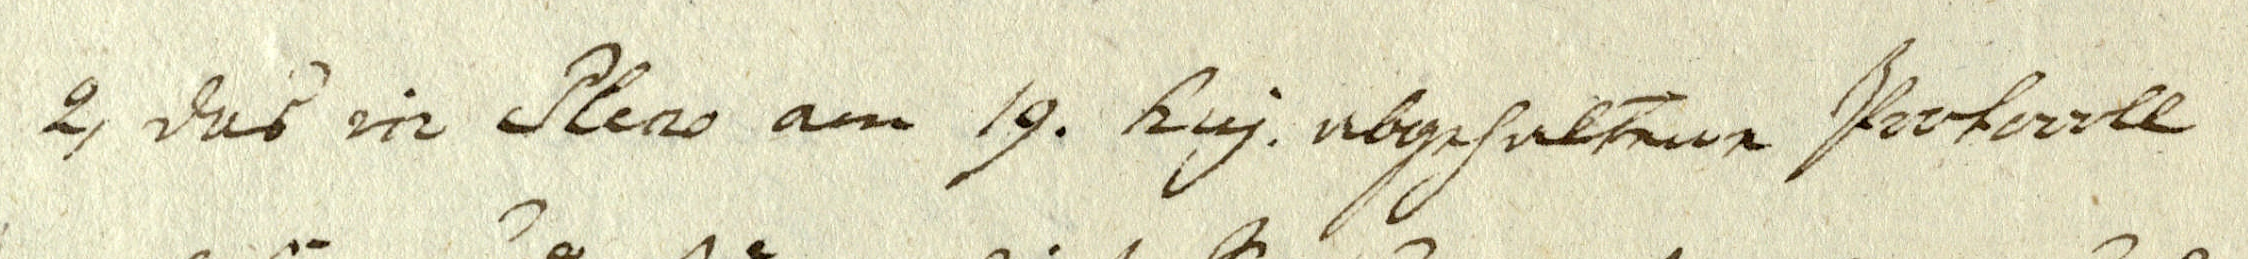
2, das in Pleno am 19. huj. abgehaltene Protocoll
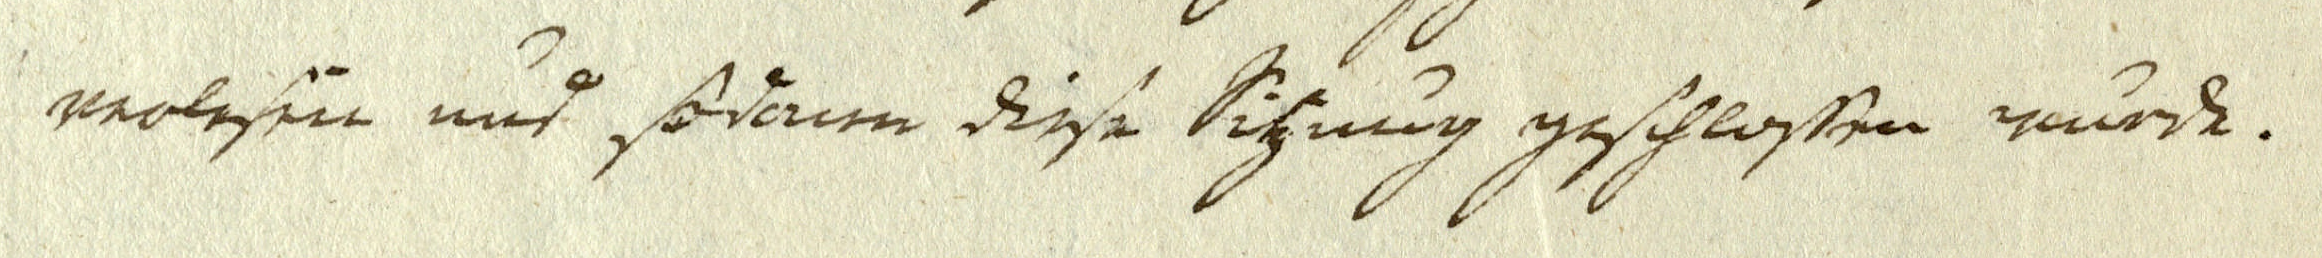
verlesen und sodann diese Sitzung geschlossen wurde.
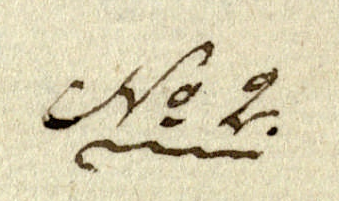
No 2.
